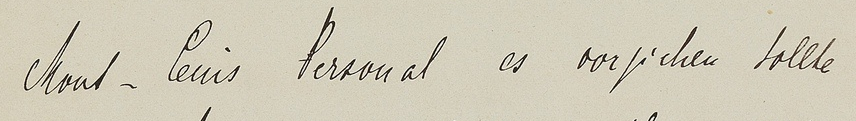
Mont-Cenis Personal es vorziehen sollte
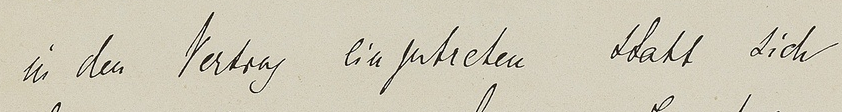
in den Vertrag einzutreten statt sich
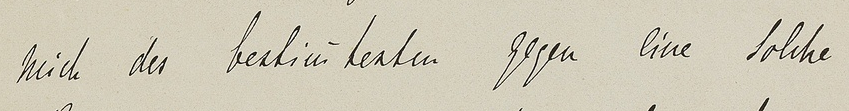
mich des bestimmtesten gegen eine solche
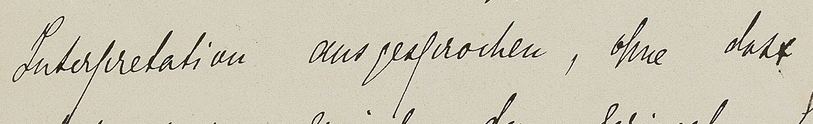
Interpretation ausgesprochen, ohne dass
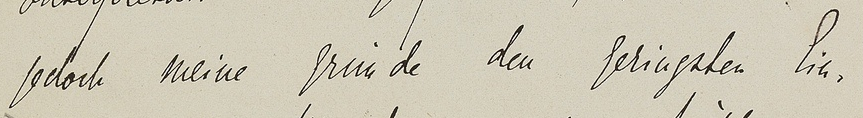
jedoch meine Gründe den geringsten Ein-
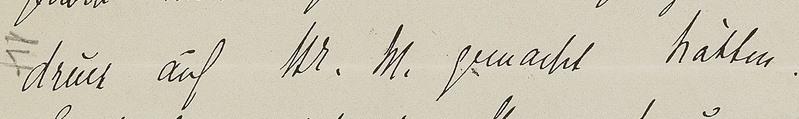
druck auf Hr. M. gemacht hätten.
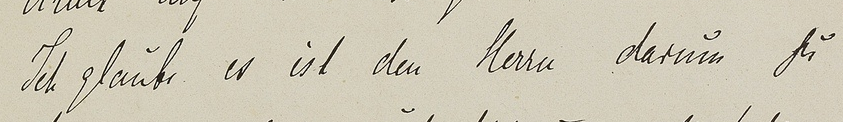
Ich glaube es ist den Herrn darum zu
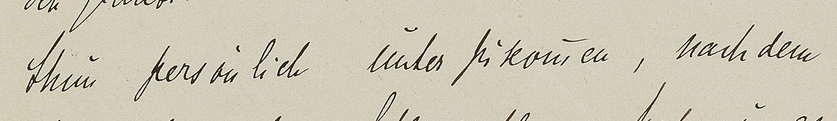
thun persönlich unterzukommen, nachdem
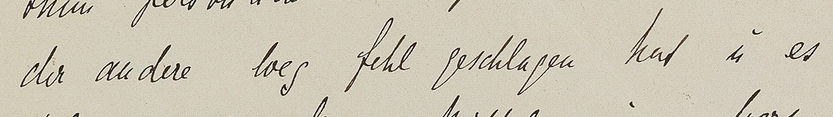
der andere Weg fehl geschlagen hat u es
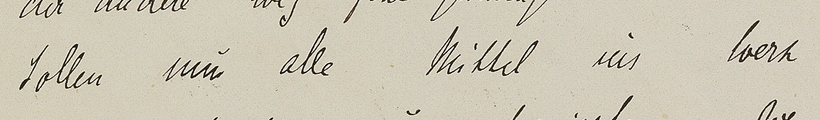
sollen nun alle Mittel ins Werk
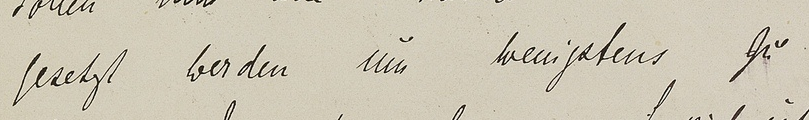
gesetzt werden um wenigstens zu
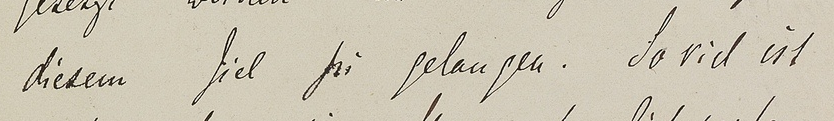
diesem Ziel zu gelangen. So viel ist
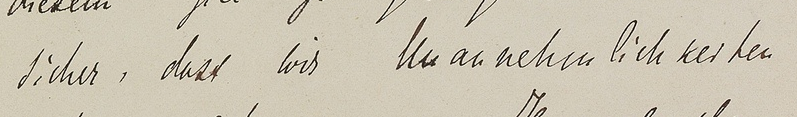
sicher, dass wir Unannehmlichkeiten
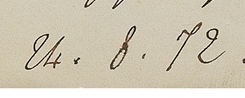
24. 8. 72.
